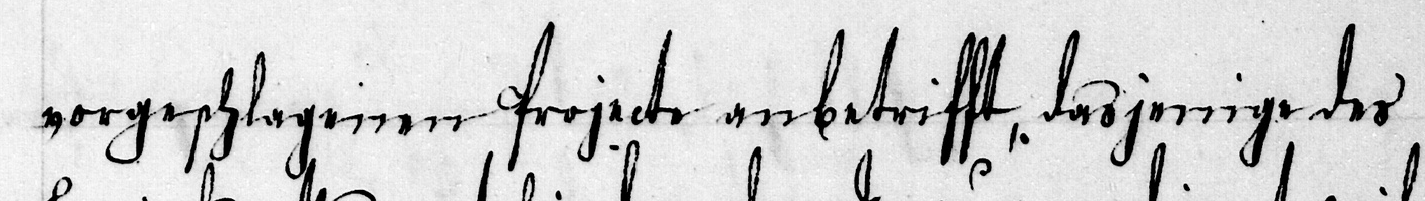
vorgeschlagenen Projecte anbetrifft, dasjenige des
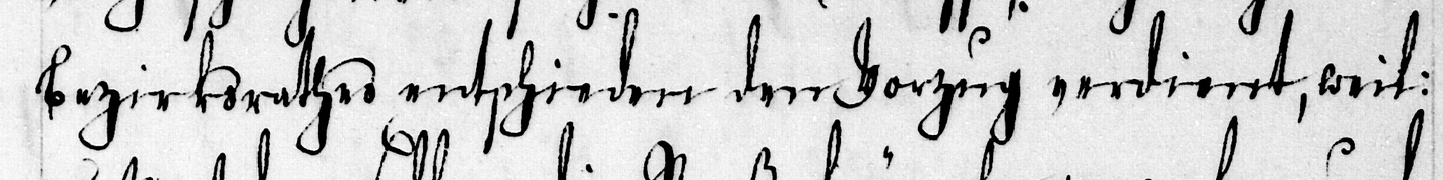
Bezirksrathes entschieden den Vorzug verdient, weil:
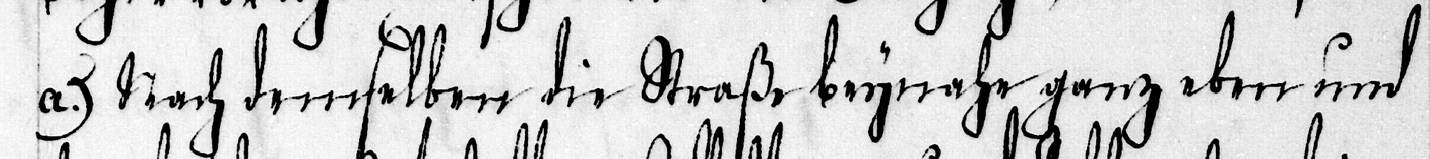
a.) Nach demselben die Straße beynahe ganz eben und
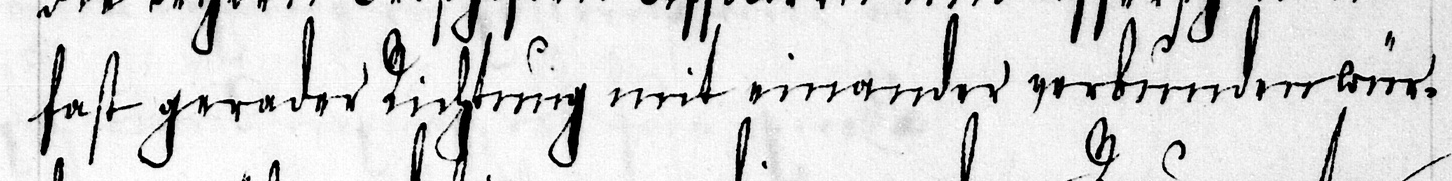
fast gerader Richtung mit einander verbunden wür¬
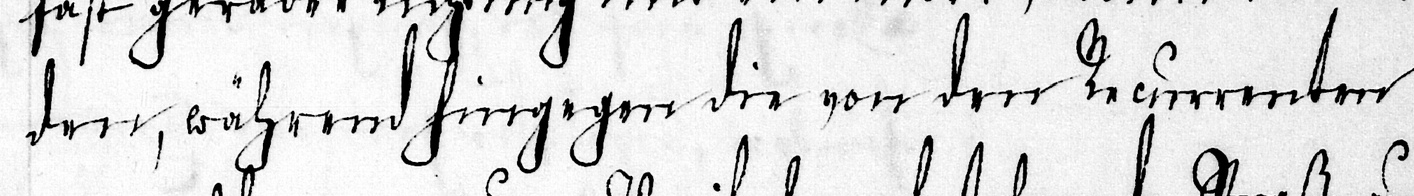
den, während hingegen die von den Recurrenten
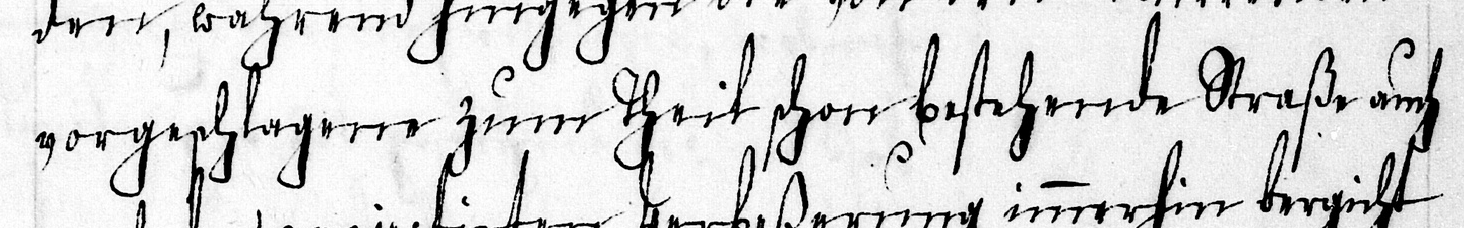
vorgeschlagene zum Theil schon bestehende Straße auch
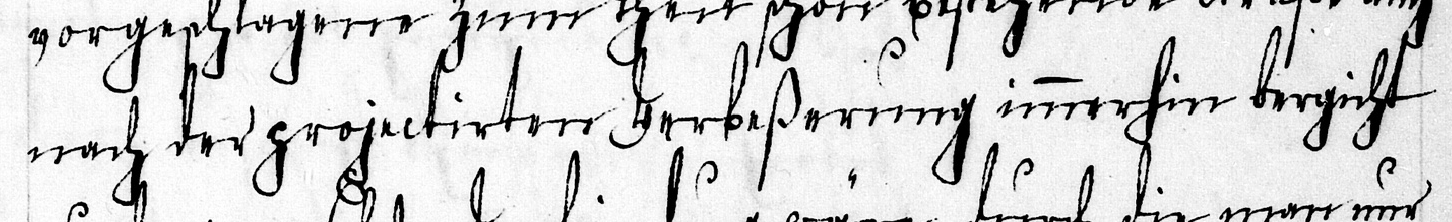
nach der projectirten Verbeßerung immerhin bergicht
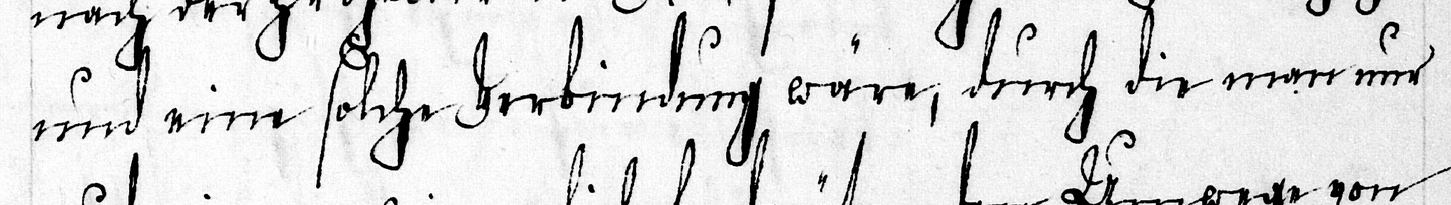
und eine solche Verbindung wäre, durch die man nur
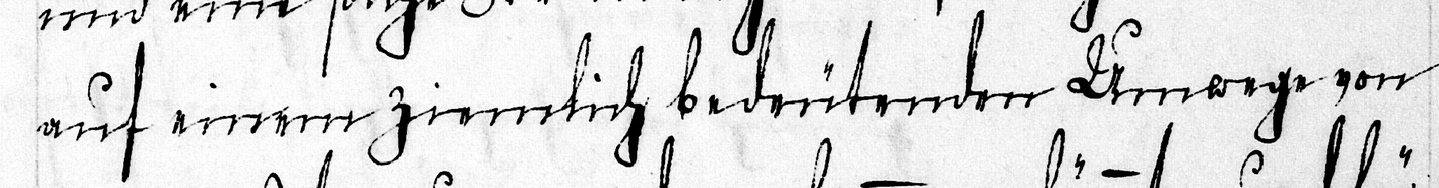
auf einem ziemlich bedeutenden Umwege von
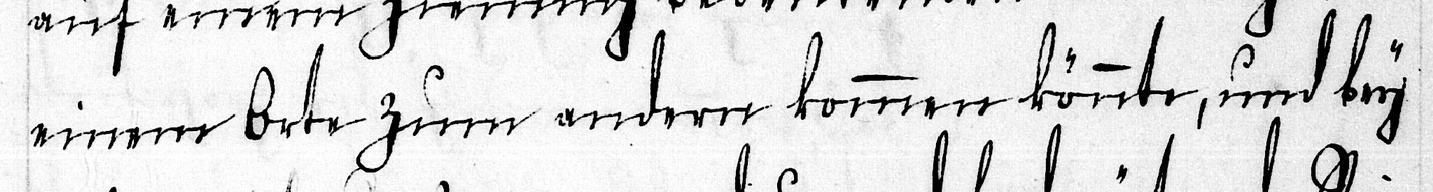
einem Orte zum andern kommen könnte, und bey
